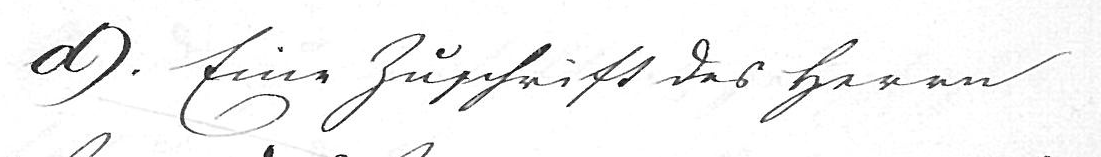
d). Eine Zuschrift des Herrn
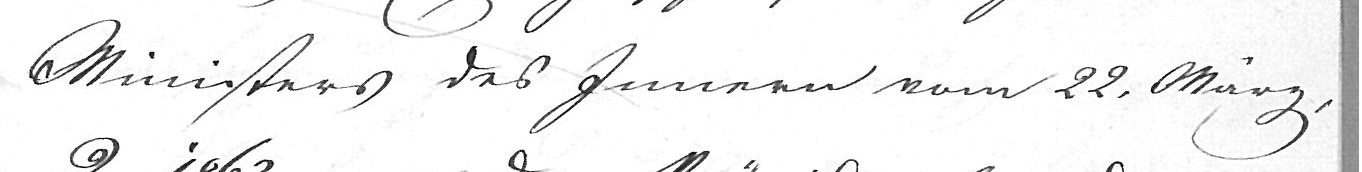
Ministers des Innern vom 22. März,
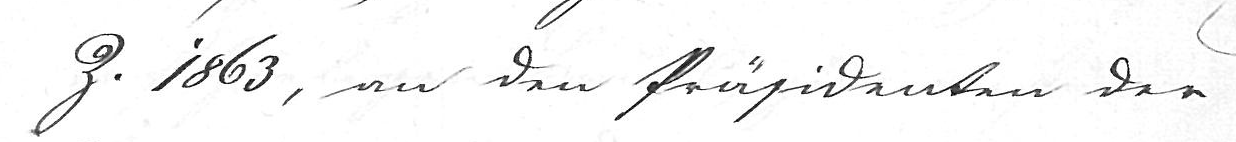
Z. 1863, an den Präsidenten der
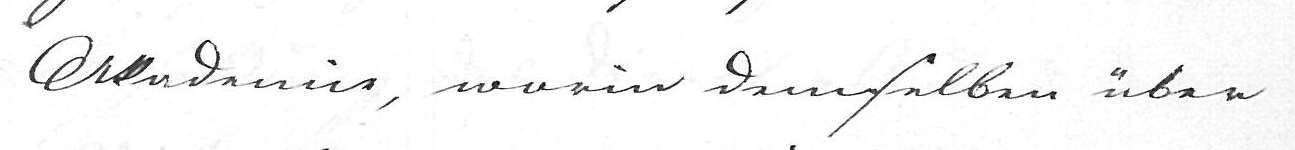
Akademie, worin demselben über
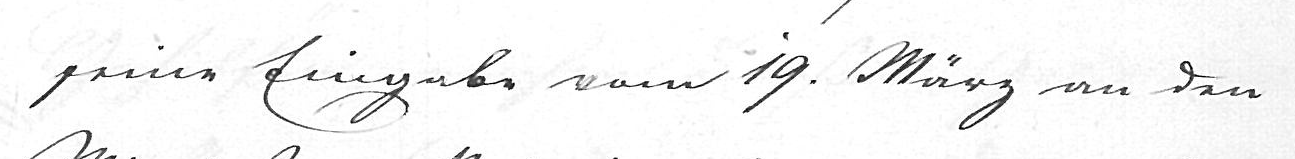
seine Eingabe von 19. März an den
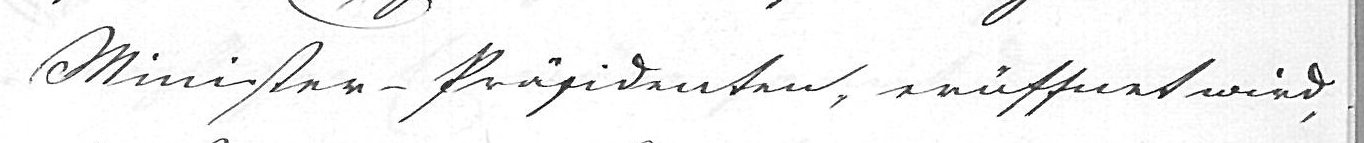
Minister-Präsidenten, eröffnet wird,
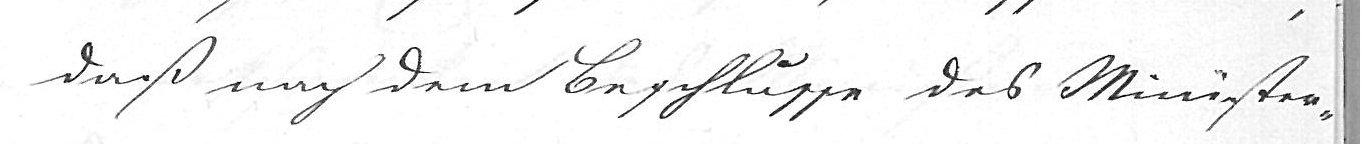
daß nach dem Beschlusse des Minister-
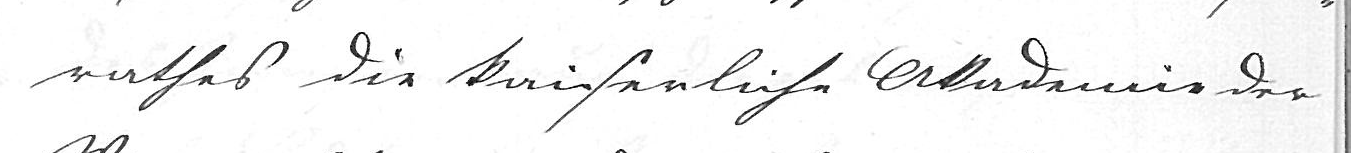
rathes die kaiserliche Akademie der
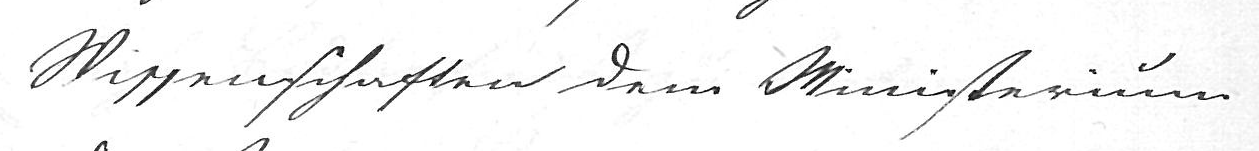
Wissenschaften dem Ministerium
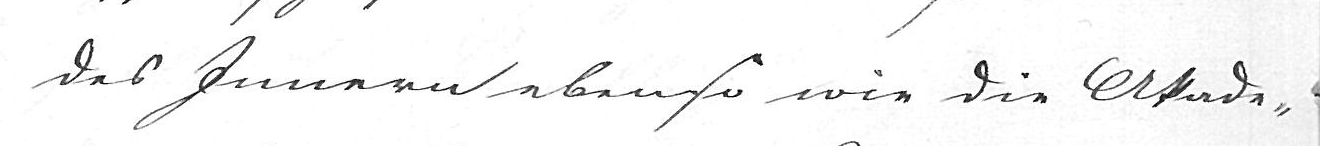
des Innern ebenso wie die Akade-
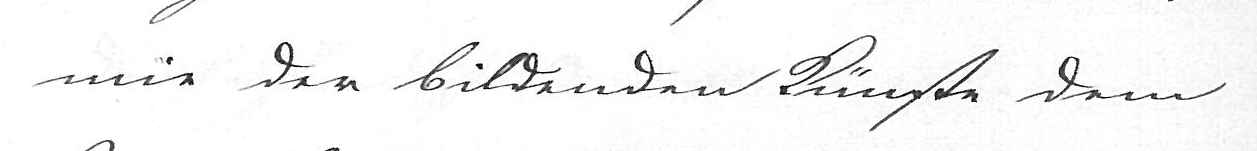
mie der bildenden Künste dem
